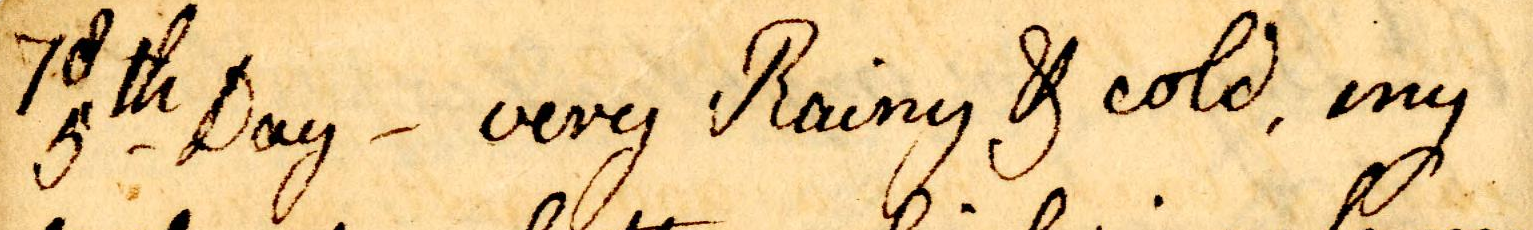5^th Day- very Rainy & cold, my
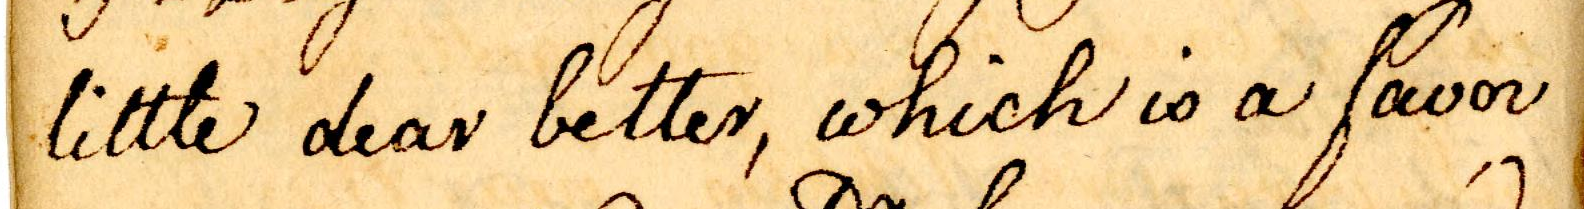little dear better, which is a favor
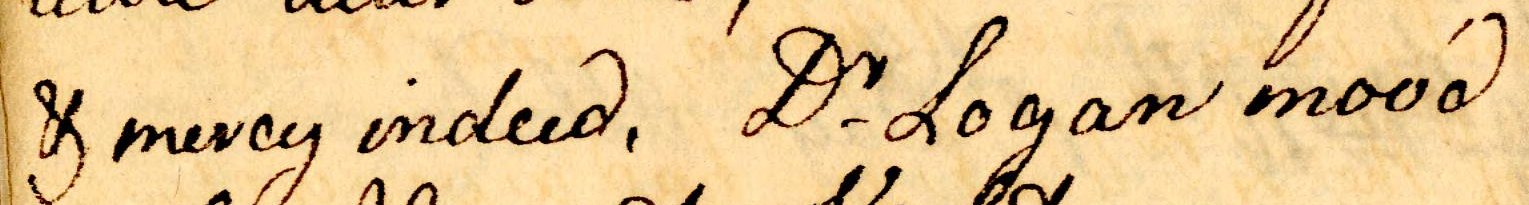& mercy indeed, D^r- Logan mov'd
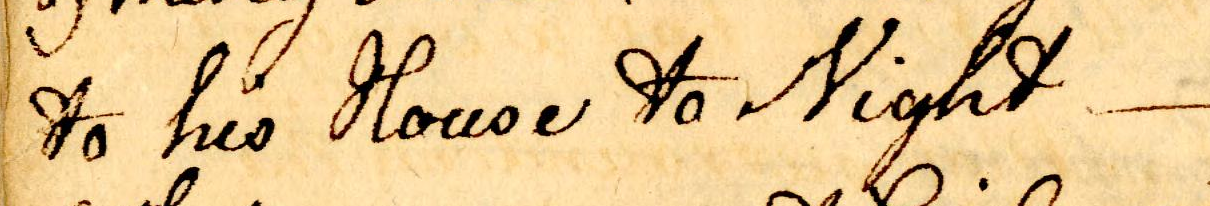to his House to Night
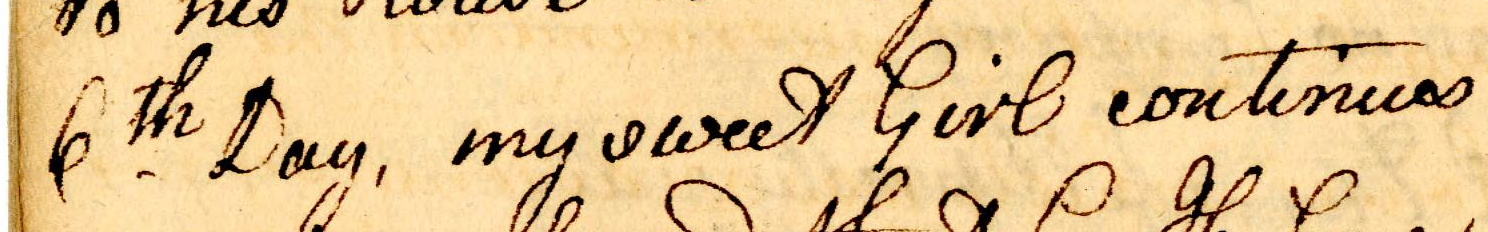6^th Day, my sweet Girl continues
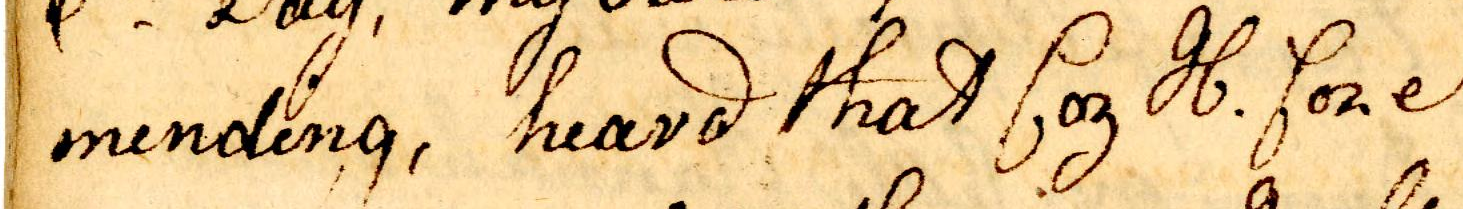mending, heard that Coz. H. Coxe
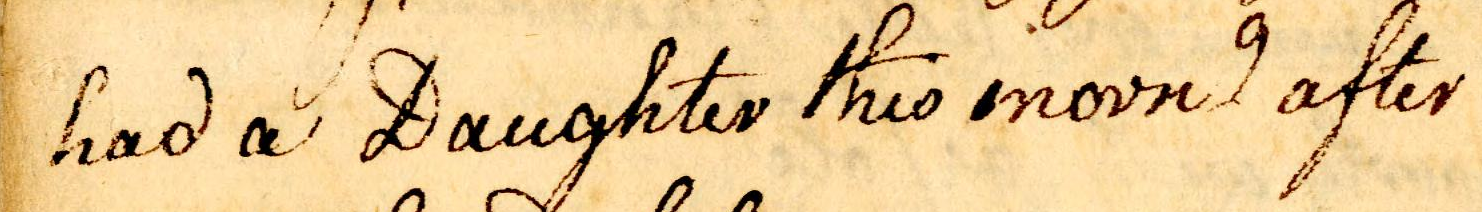had a Daughter this morn^g after
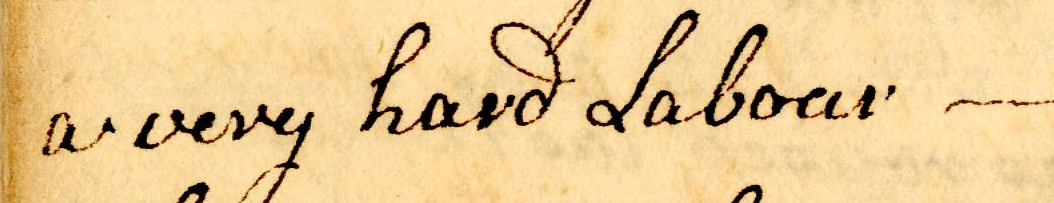a very hard Labour
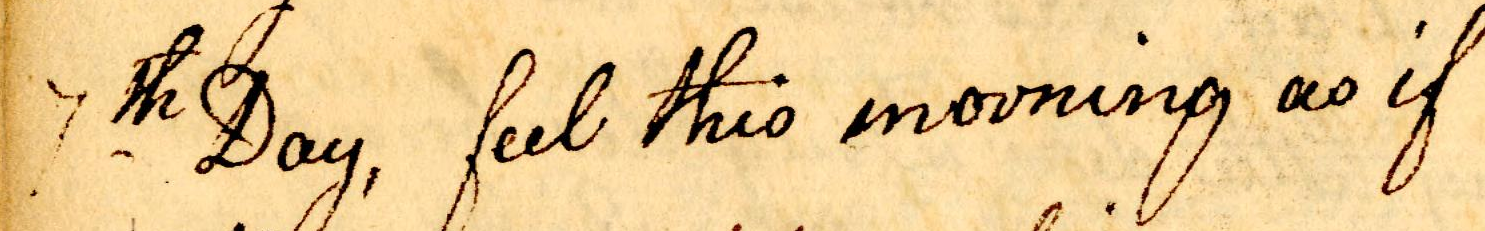7^th Day, feel this morning as if
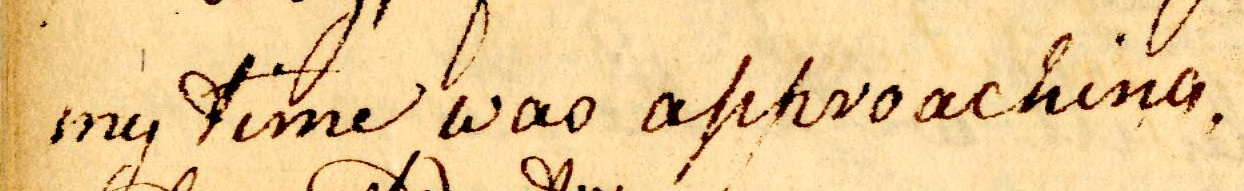my time was approaching,
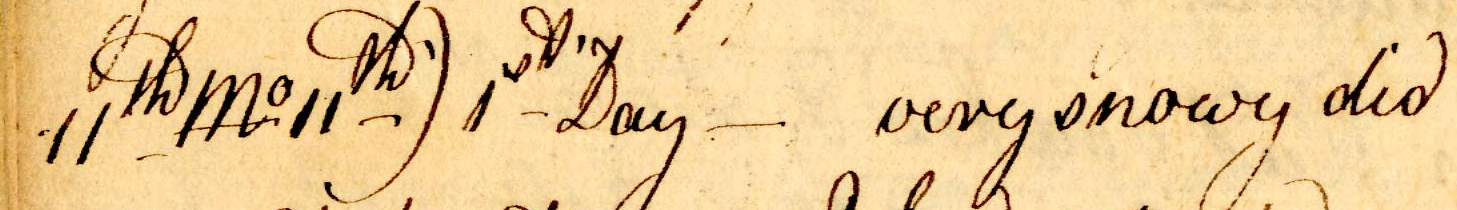11^th M^o 11^th) 1^st Day- very snowy did
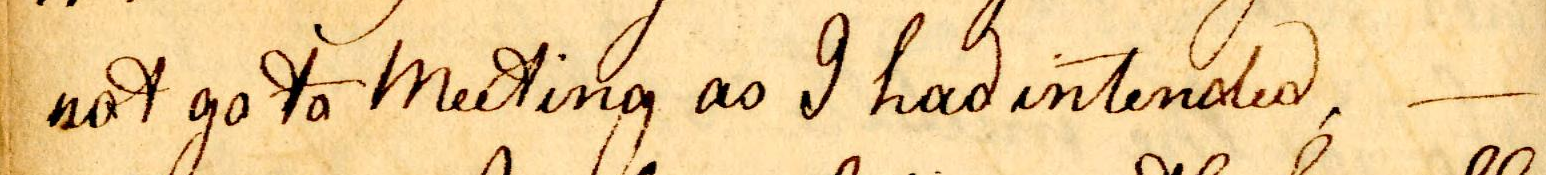not go to Meeting as I had intended,-
